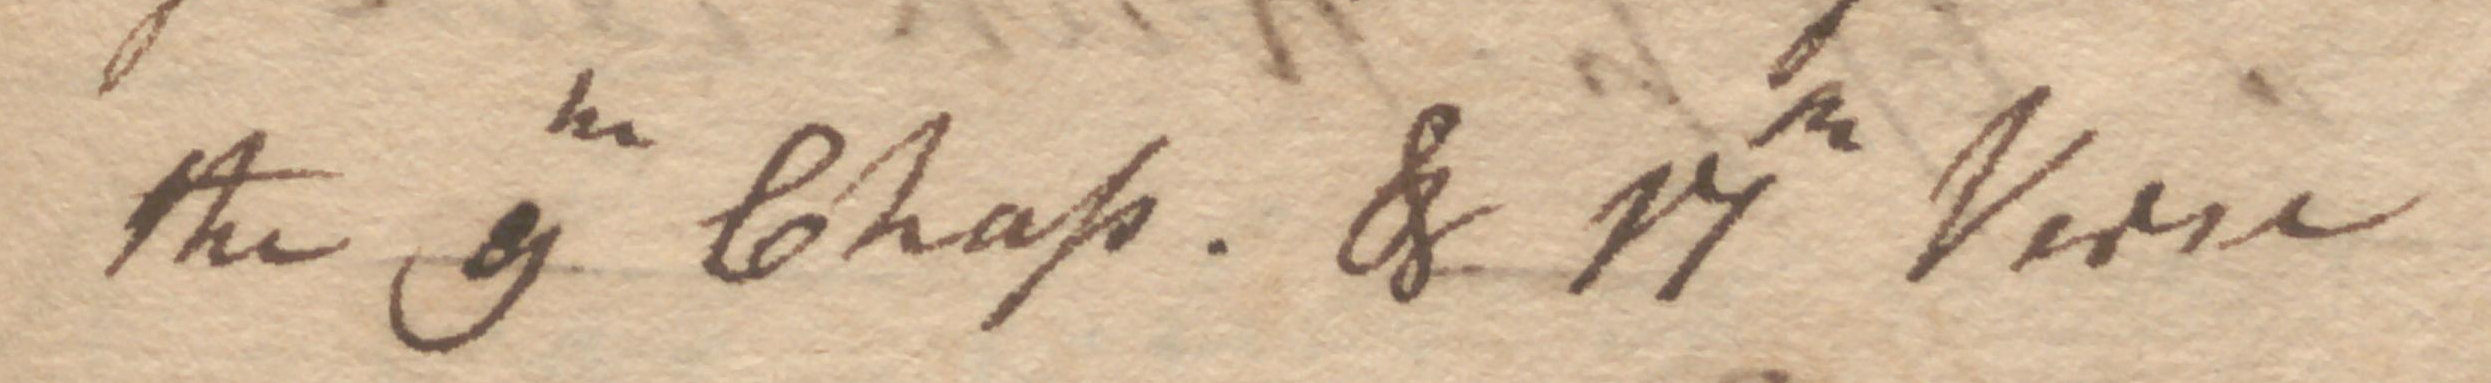the 9^th Chap. & 17^th Verse
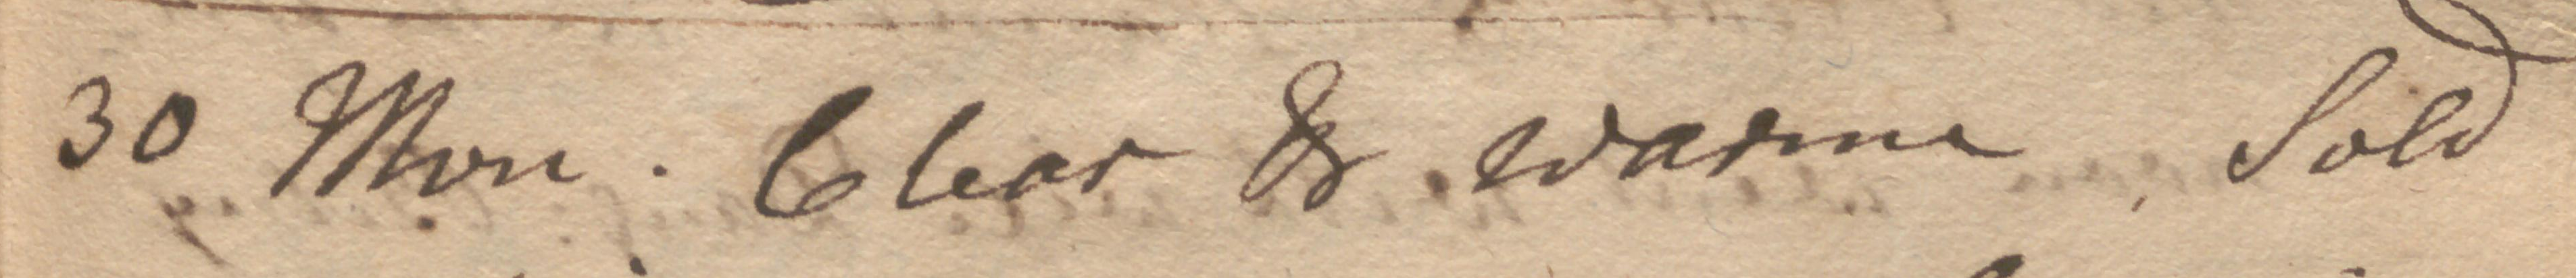30 Mon^s. Clear & warme. sold
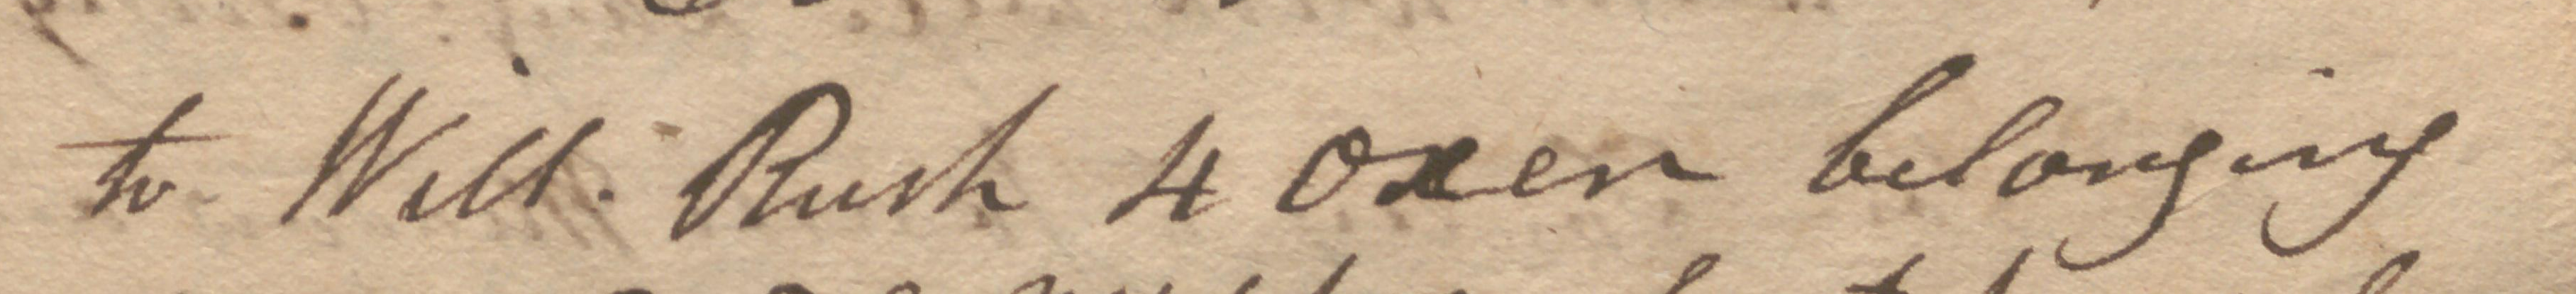to Will. Rush 4 oxen belonging
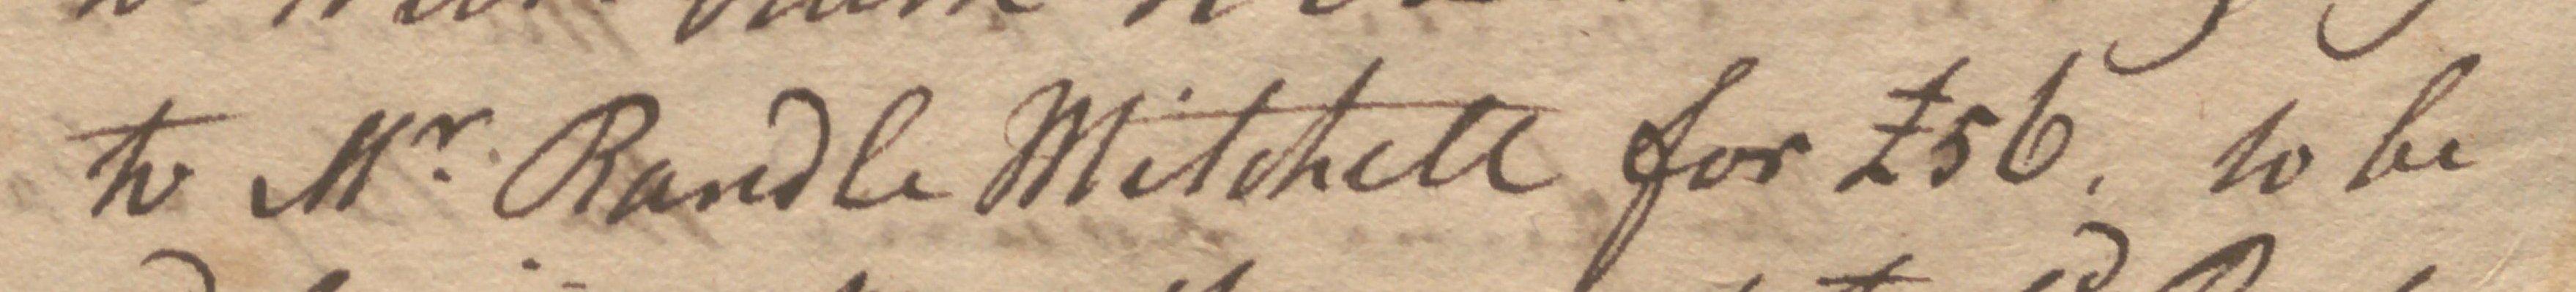to M^r. Randle Mitchell for £56. to be
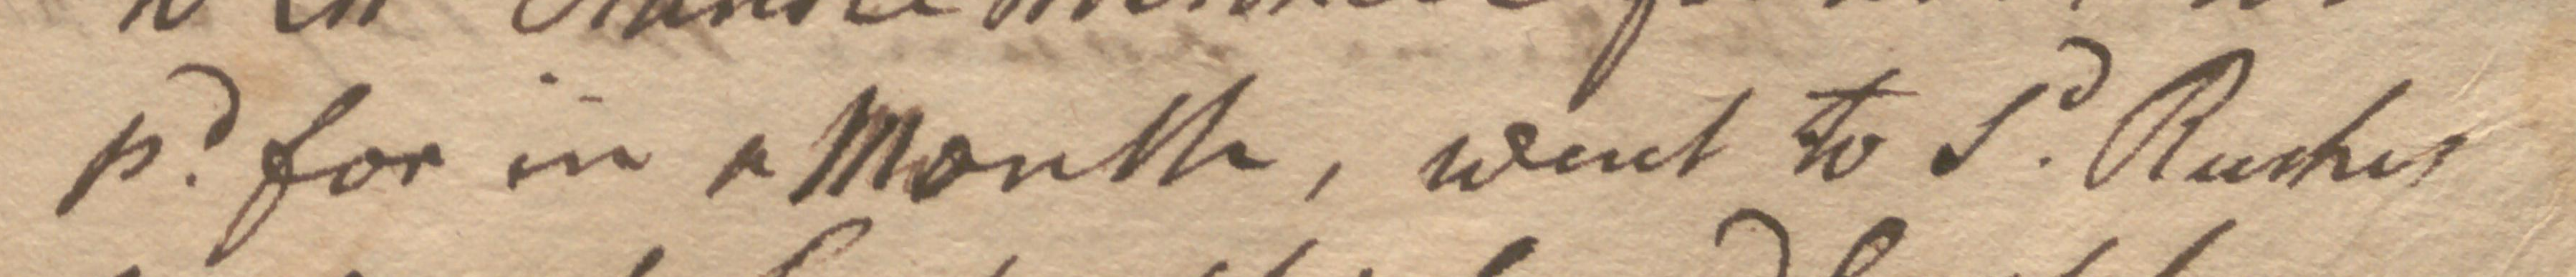p^d. for in a Month, went to s^d. Rushes
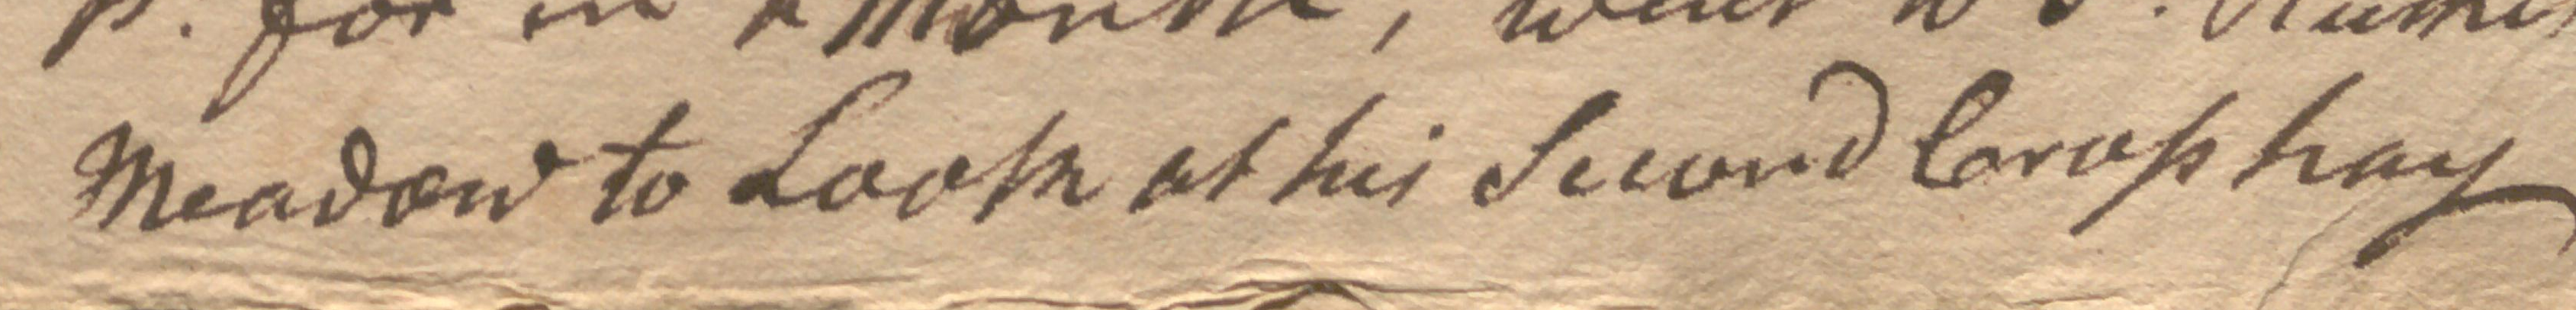Meadow to Look at his Second Crop hay
